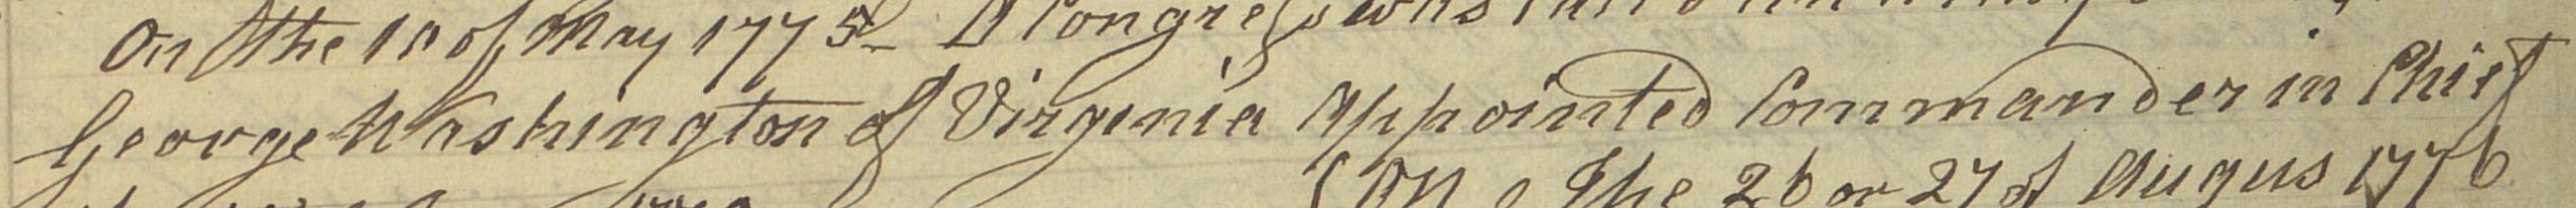George Washington of Virginia appointed Commander in Chief
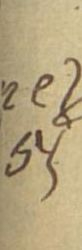-re
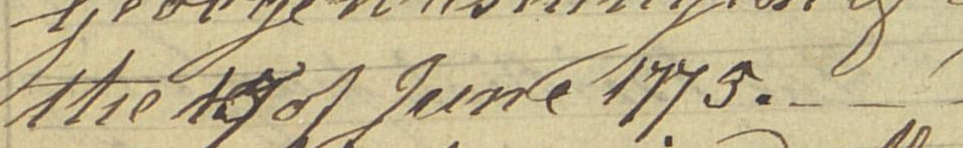tho 17 of June 1773.
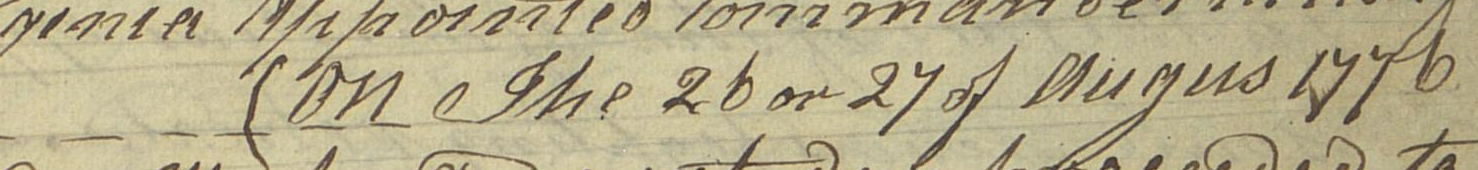(On the 26 or 27 of Augus 1776
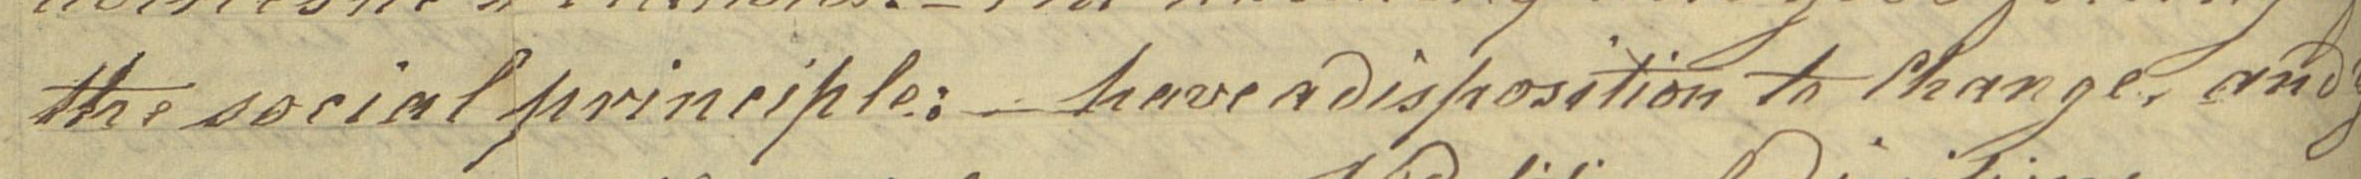the social principle:- have a disposition to change and
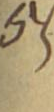5
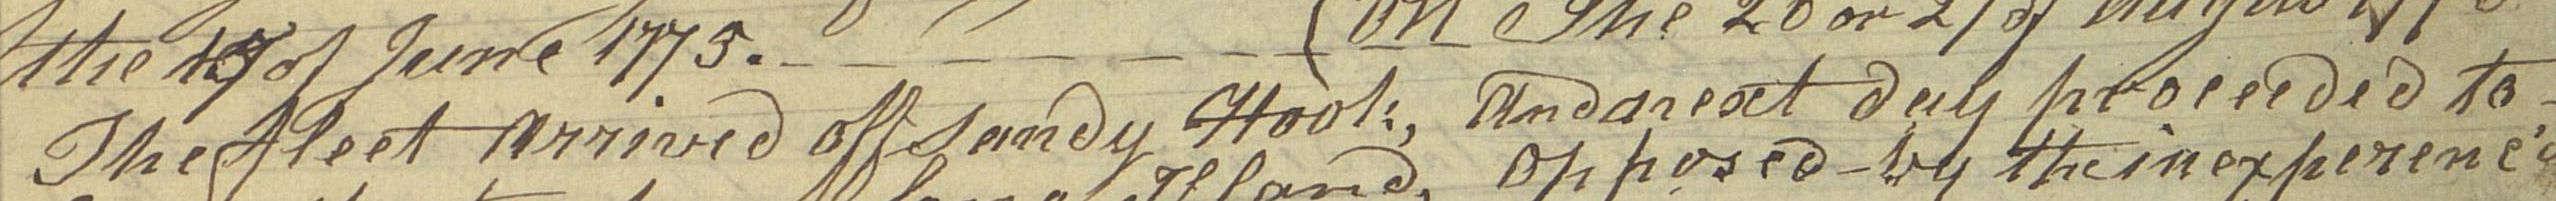The fleet arrived off Sandy Hook, and a next day proceeded to
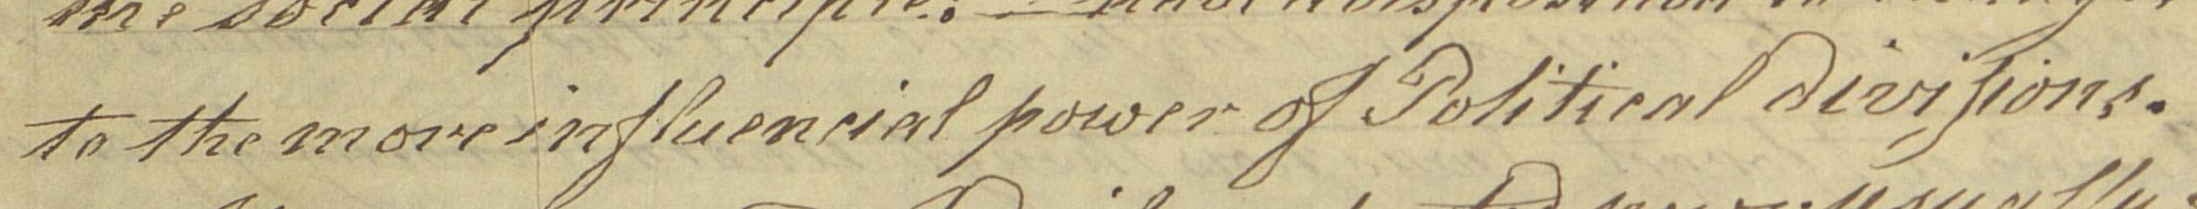to the more influencial power of Political divisions.
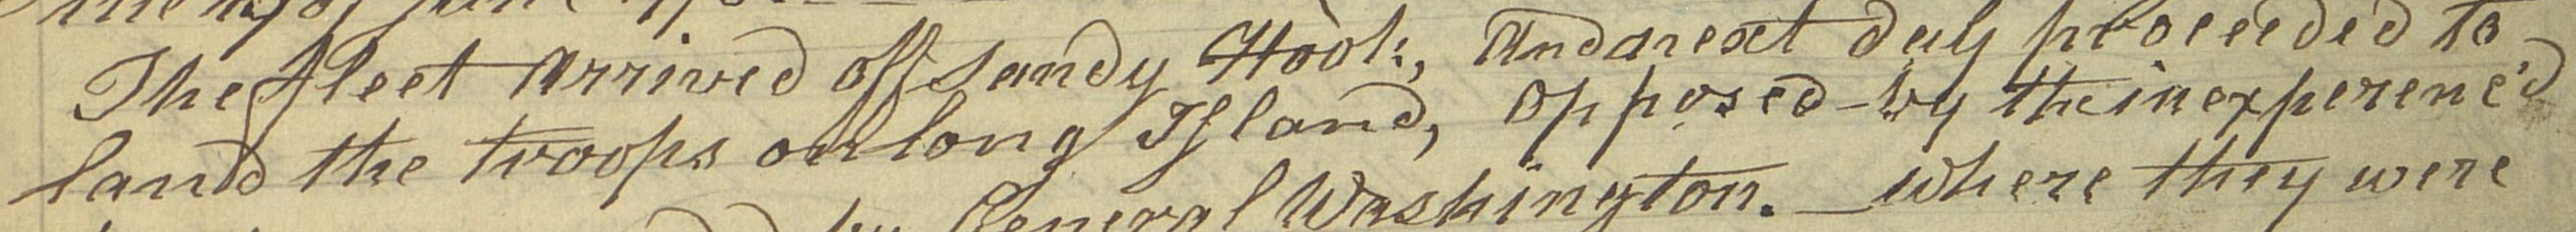land the troops on long Island, opposed by the inexperenc'd
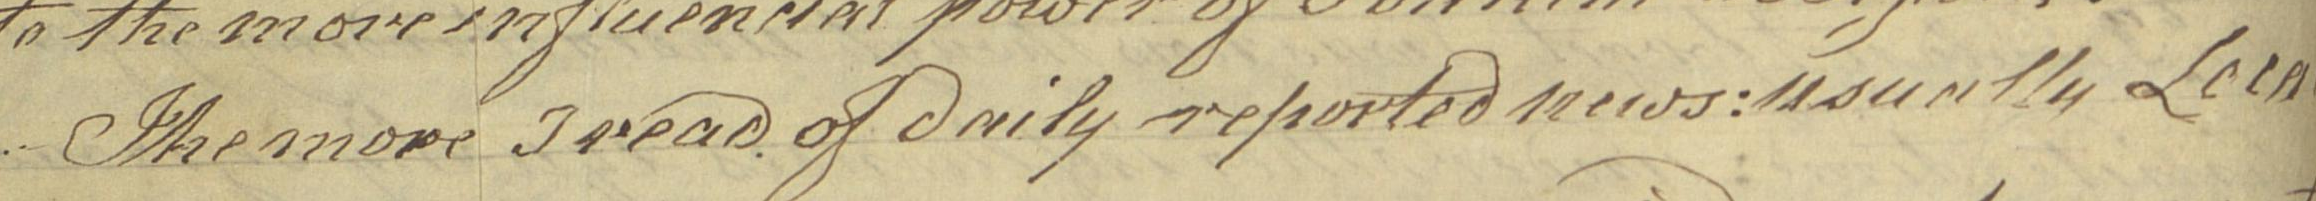The more I read of daily reported news: usually Lo-
